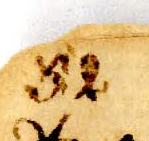52
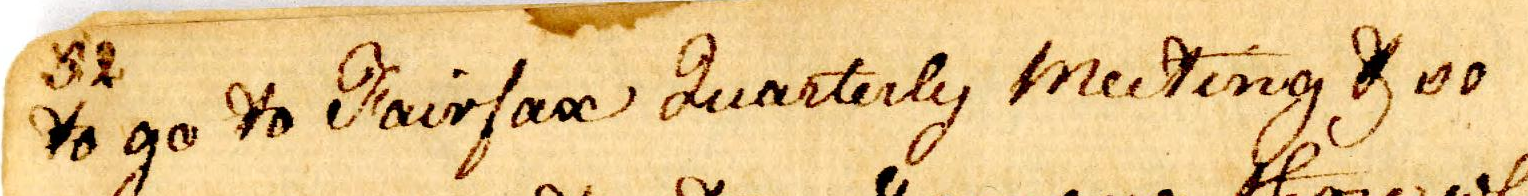to go to Fairfax Quarterly Meeting & so
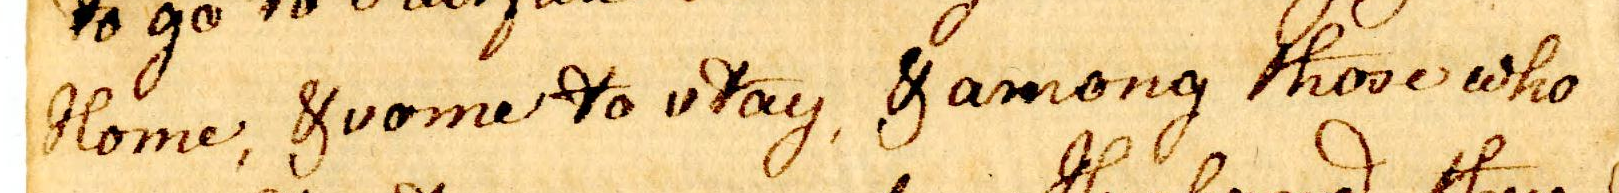Home, & some to stay, & among those who
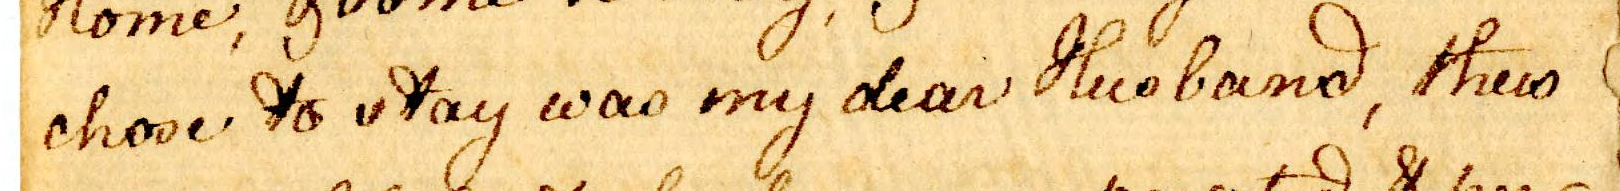chose to stay was my dear Husband, thus
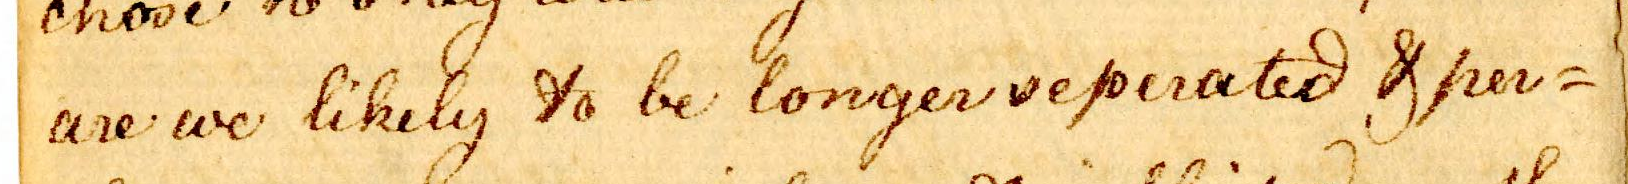are we likely to be longer seperated & per-
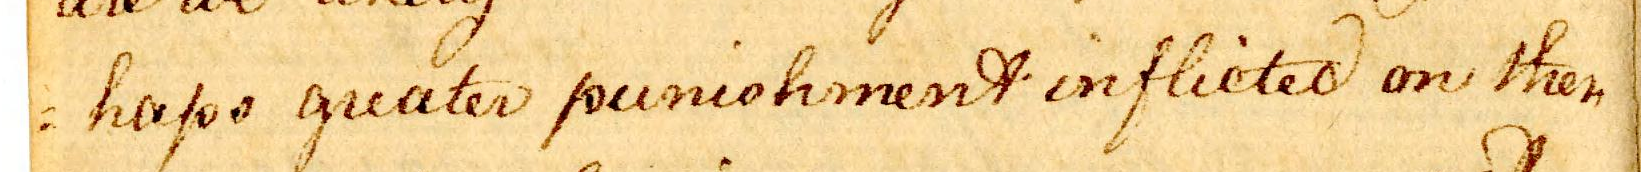-haps greater punishment inflicted on then
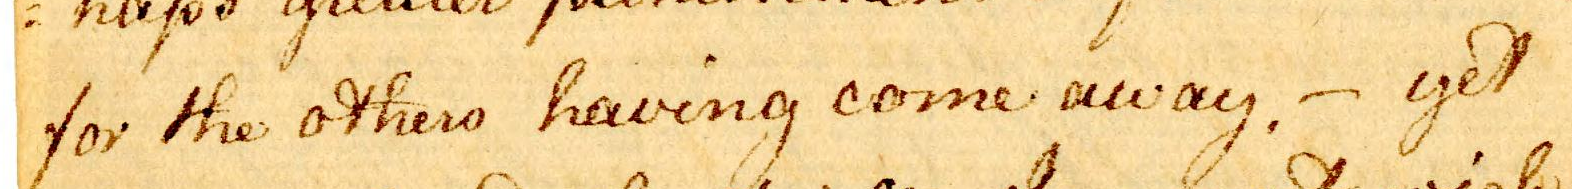for the others having come away- yet
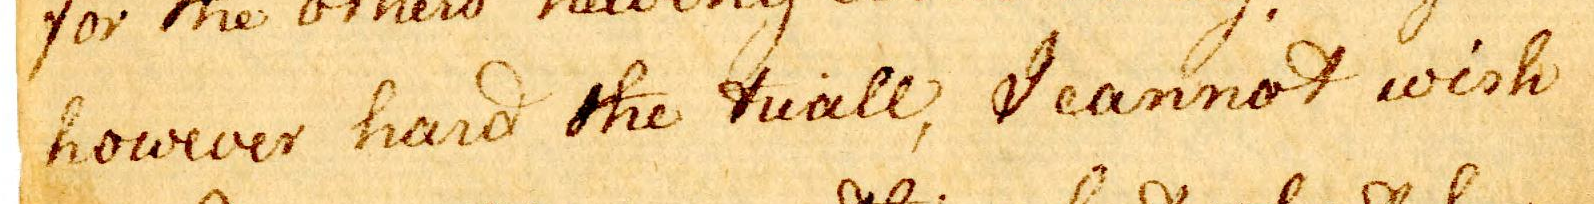however hard the triall, I cannot wish
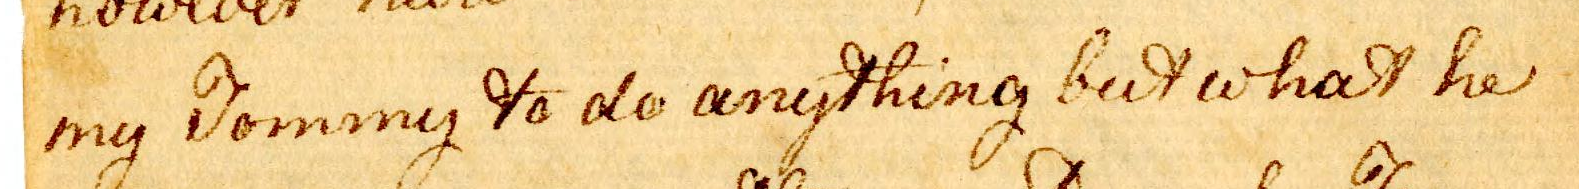my Tommy to do anything but what he
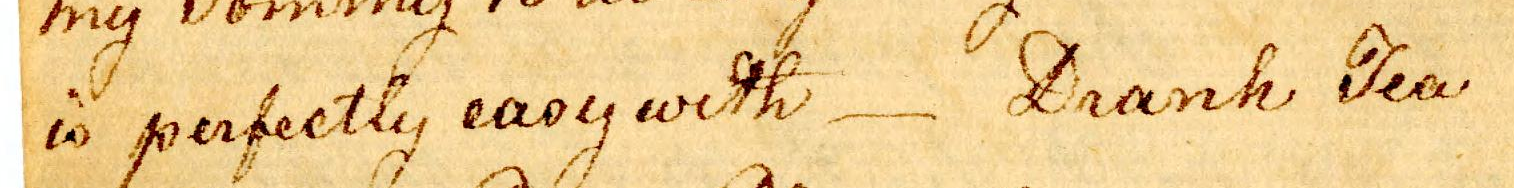is perfectly easy with- Drank Tea
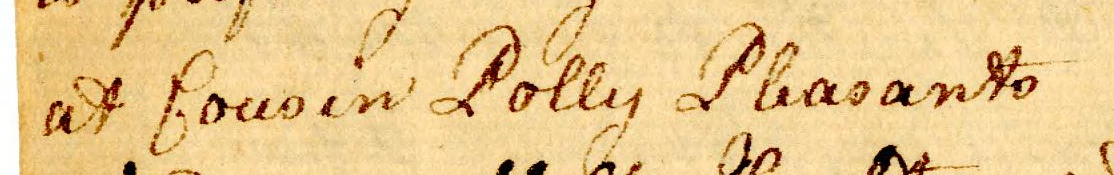at Cousin Polly Pleasants
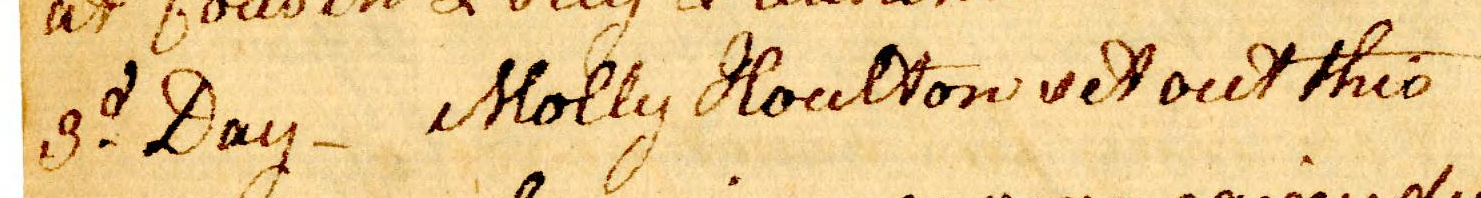3^d. Day- Molly Houlton set out this
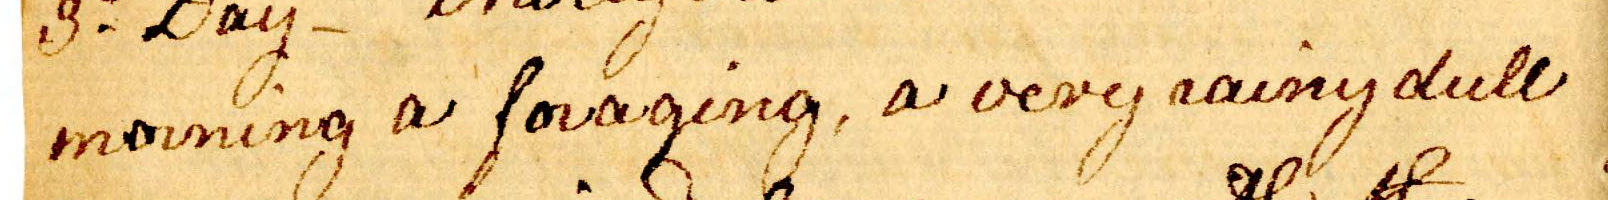morning a foraging, a very rainy dull
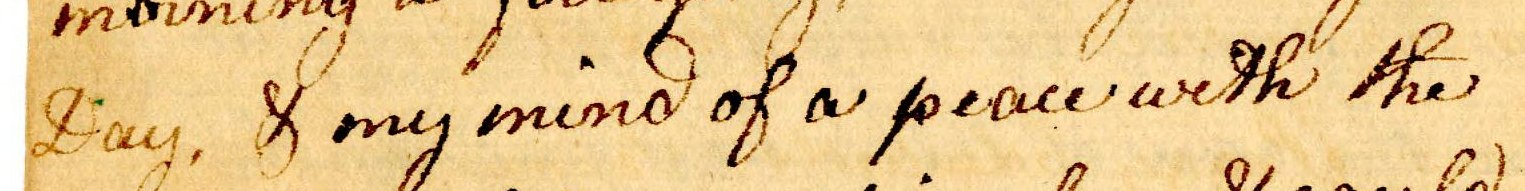Day, & my mind of a peace with the
